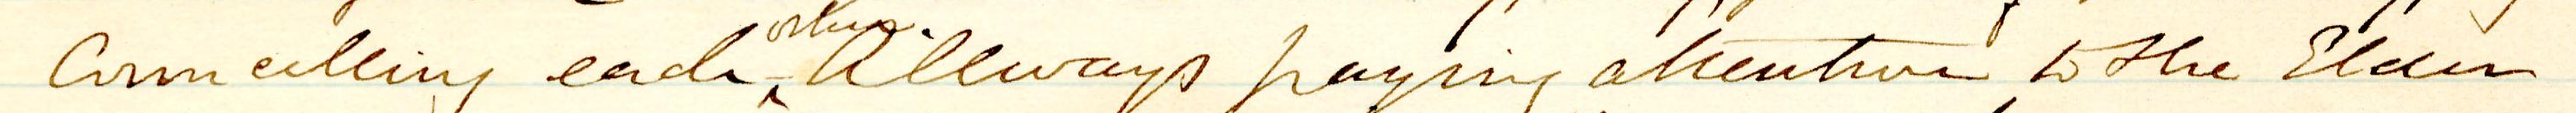Conceilling each ^ allways paying attentive to the Elder
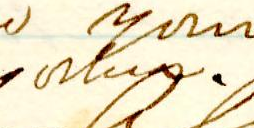other
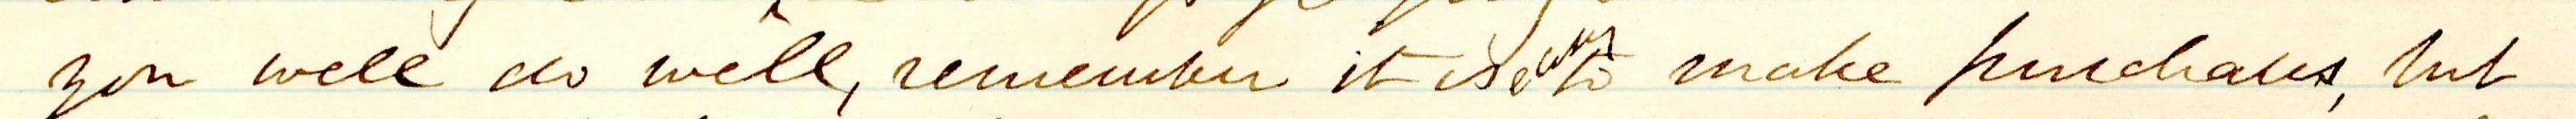you will do well, remember it is easy to make purchases, but
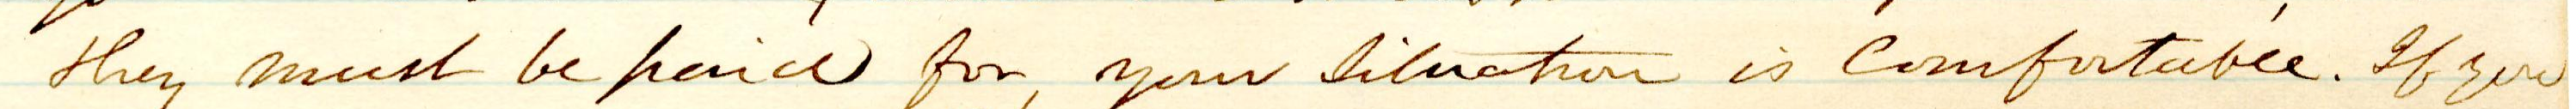they must be paid for, your situation is comfortable. If you
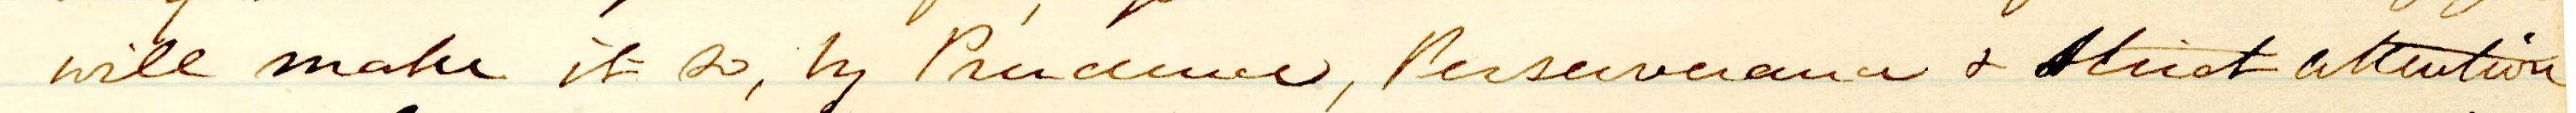will make it so, by Prudence, Perseverance & strict attention
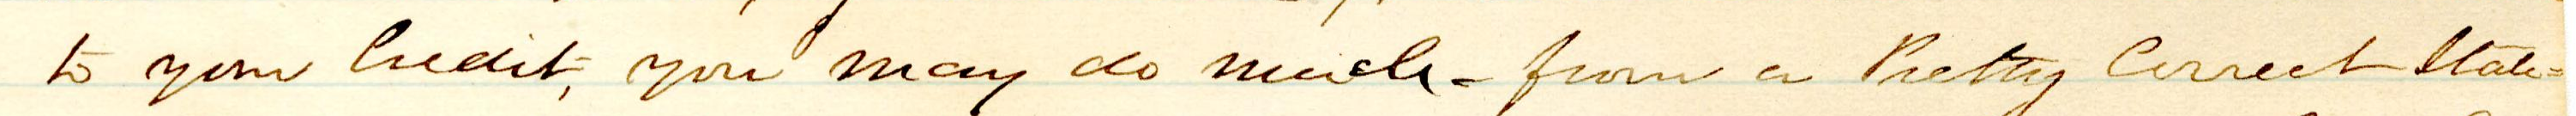to your Credit, you may do much- from a pretty correct state-
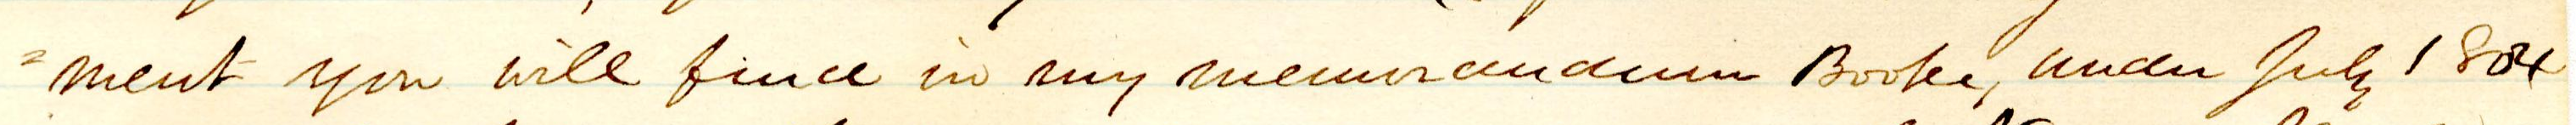-ment you will find in my memorandum booke made July 1804
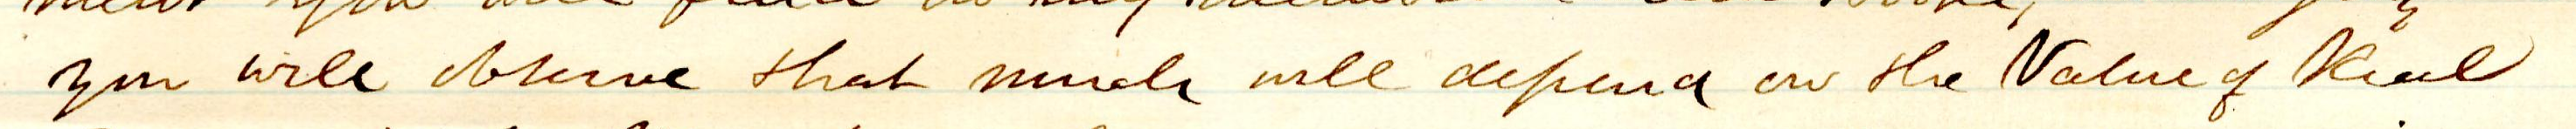you will observe that much will depend on the Value of Real
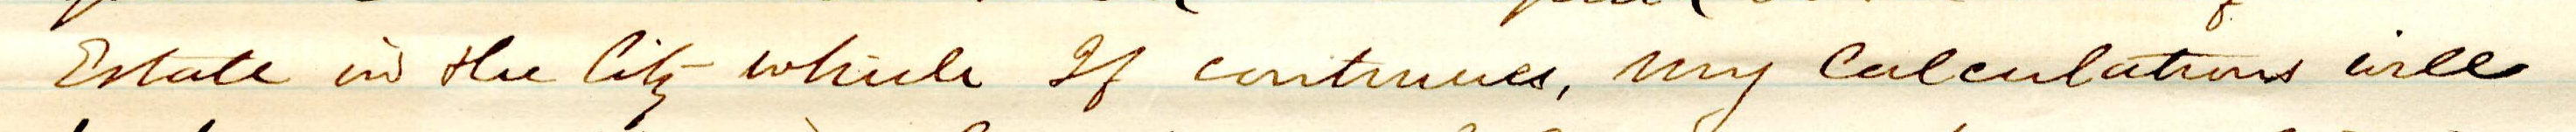Estate in the City- which If continues, my calculations will
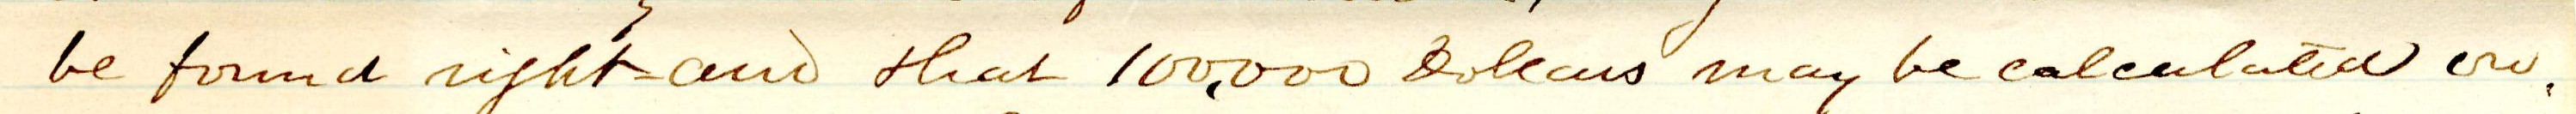be found right and that 100,000 Dollars may be calculated on.
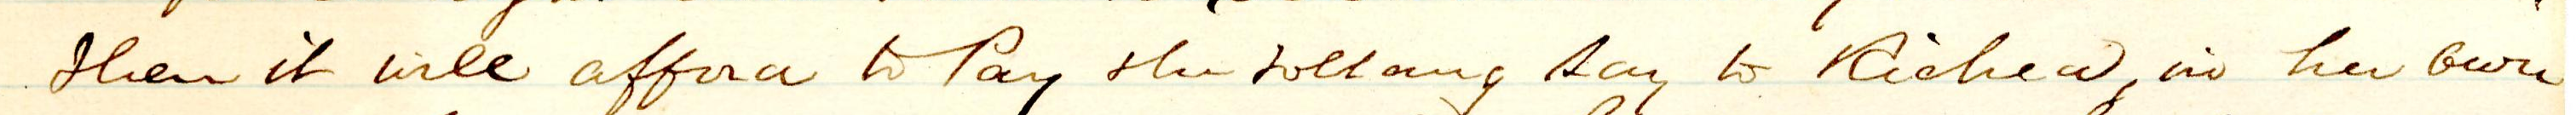Then it will afford to Pay the following say to Richea, in her own
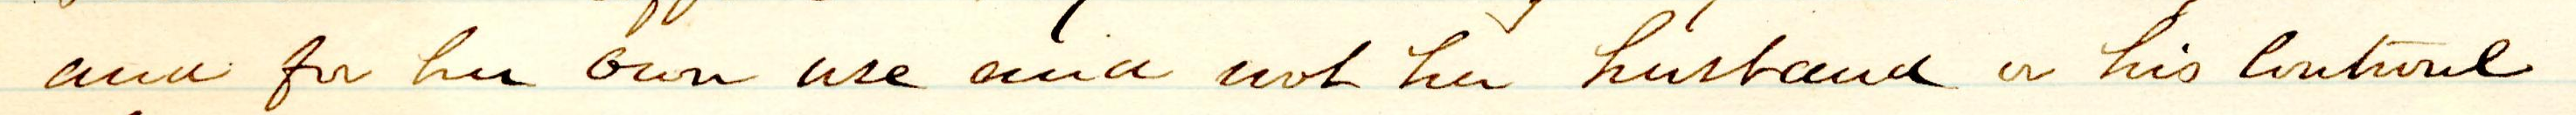and for her own use and not her husband as his continue
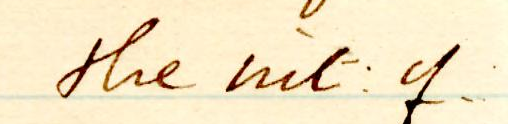the nit of
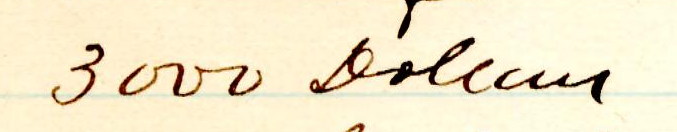3000 dollars
